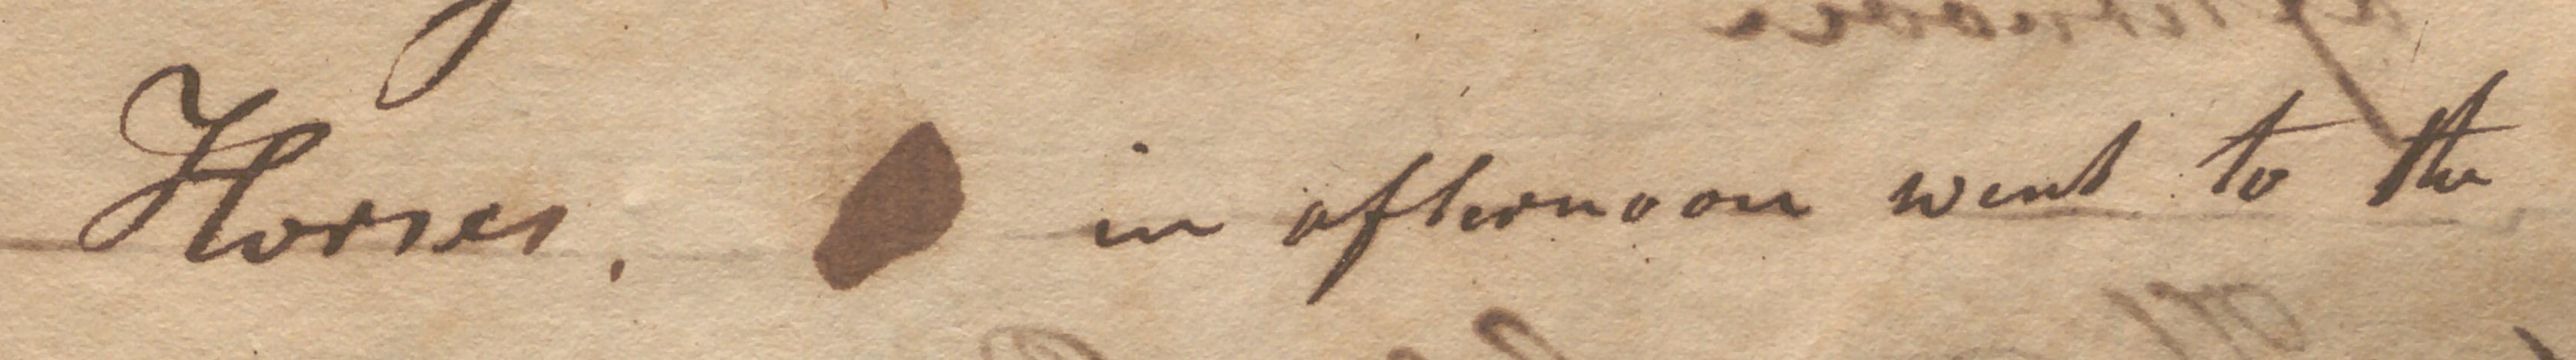Horres, in afternoon went to the
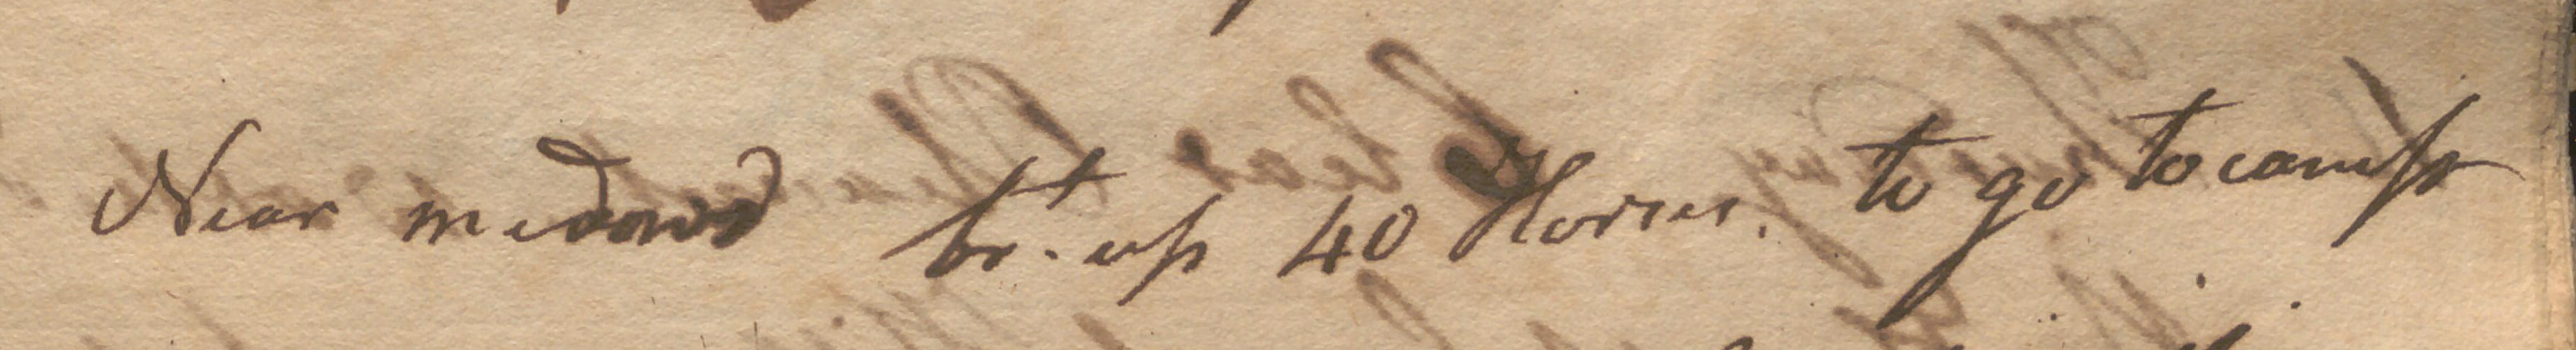Near medows br^t. up 40 Horses to go to camp
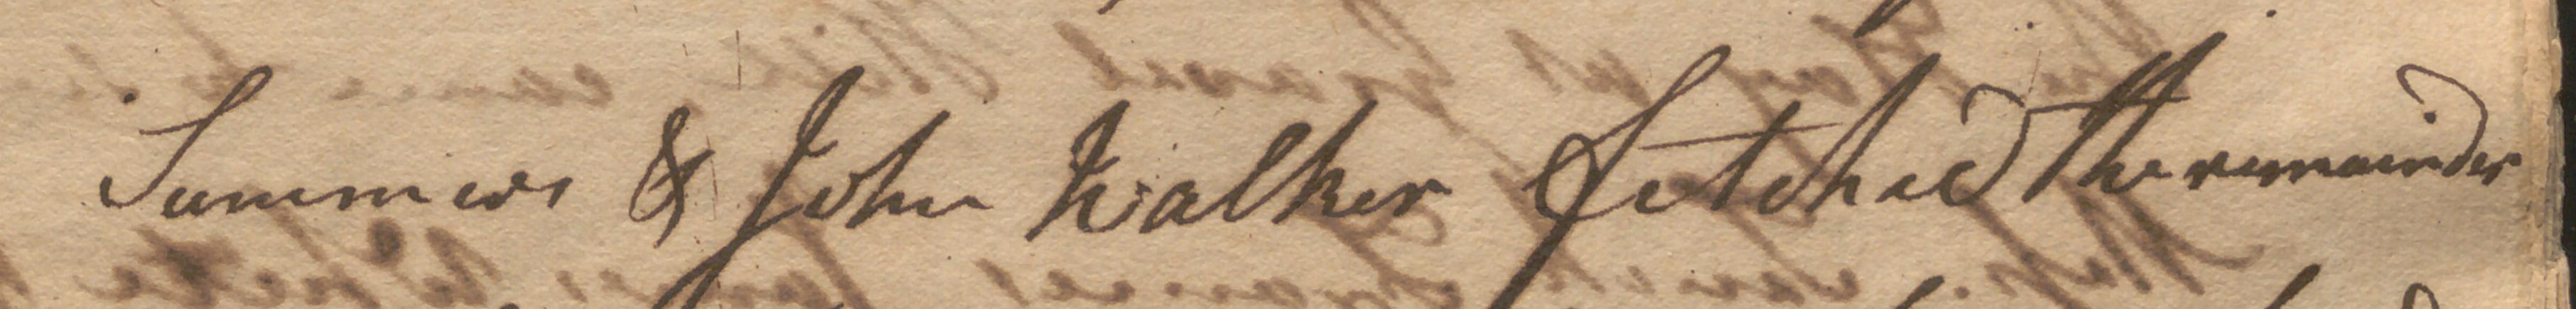Summers & John walker fetched the remainder
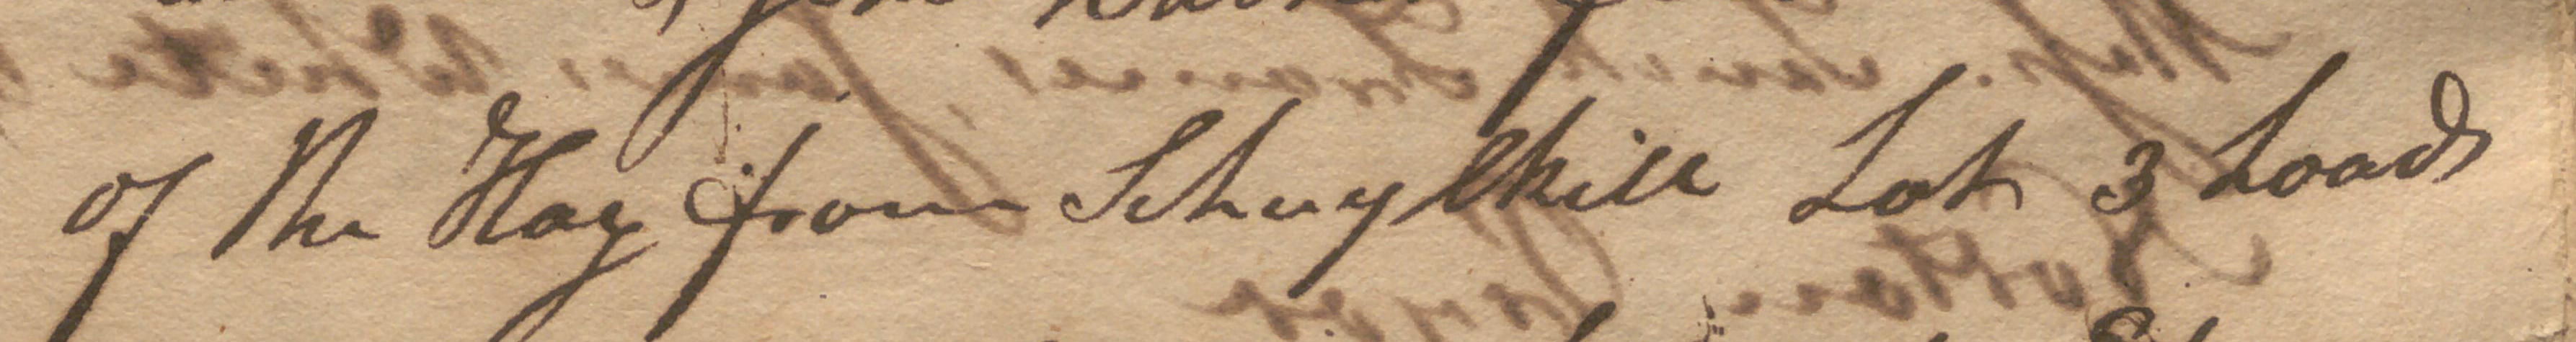of the Hay from Schuylkill Lot 3 Loads
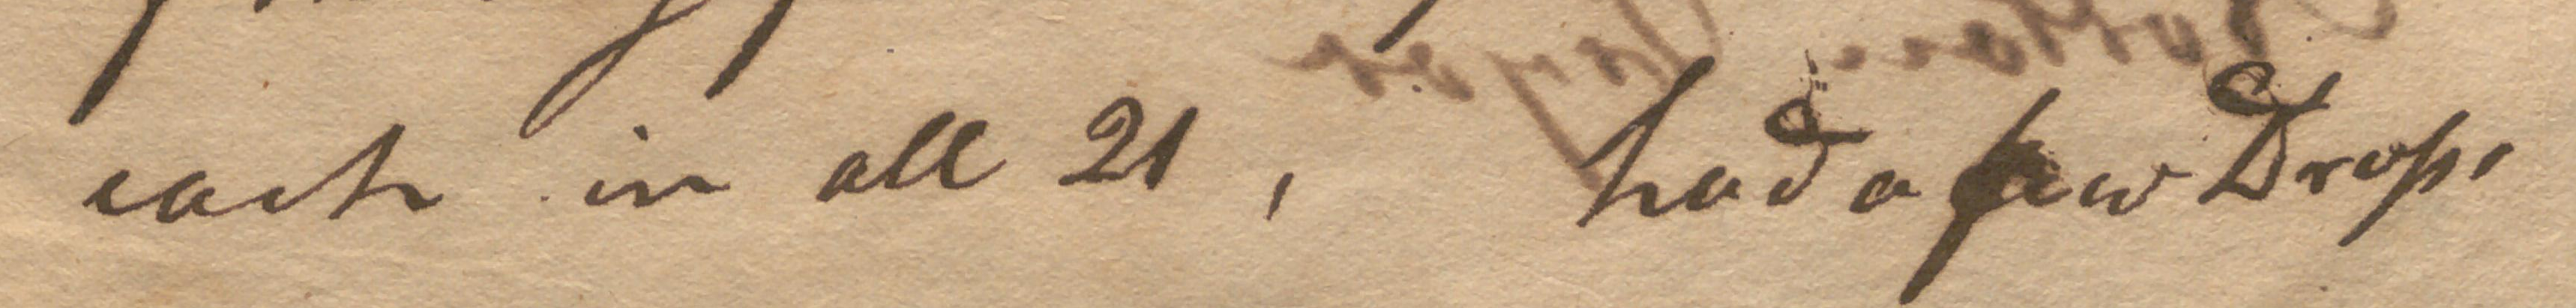each in all 21, had a few Drops
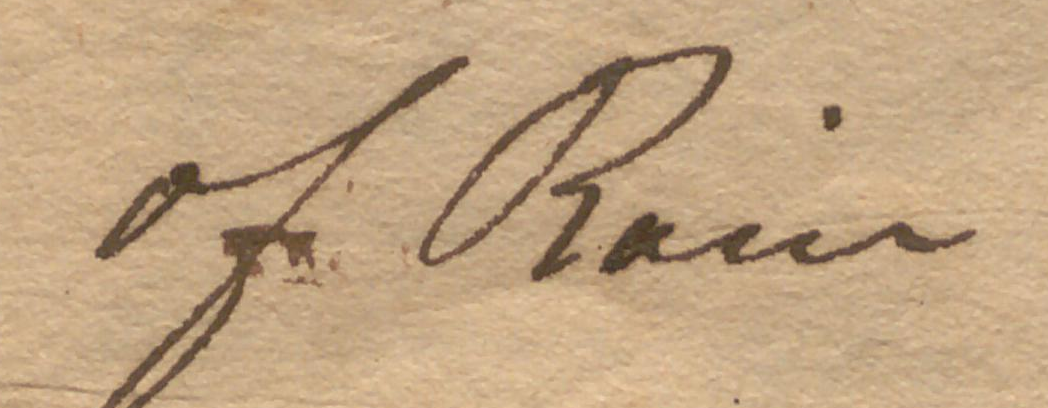of Rain
